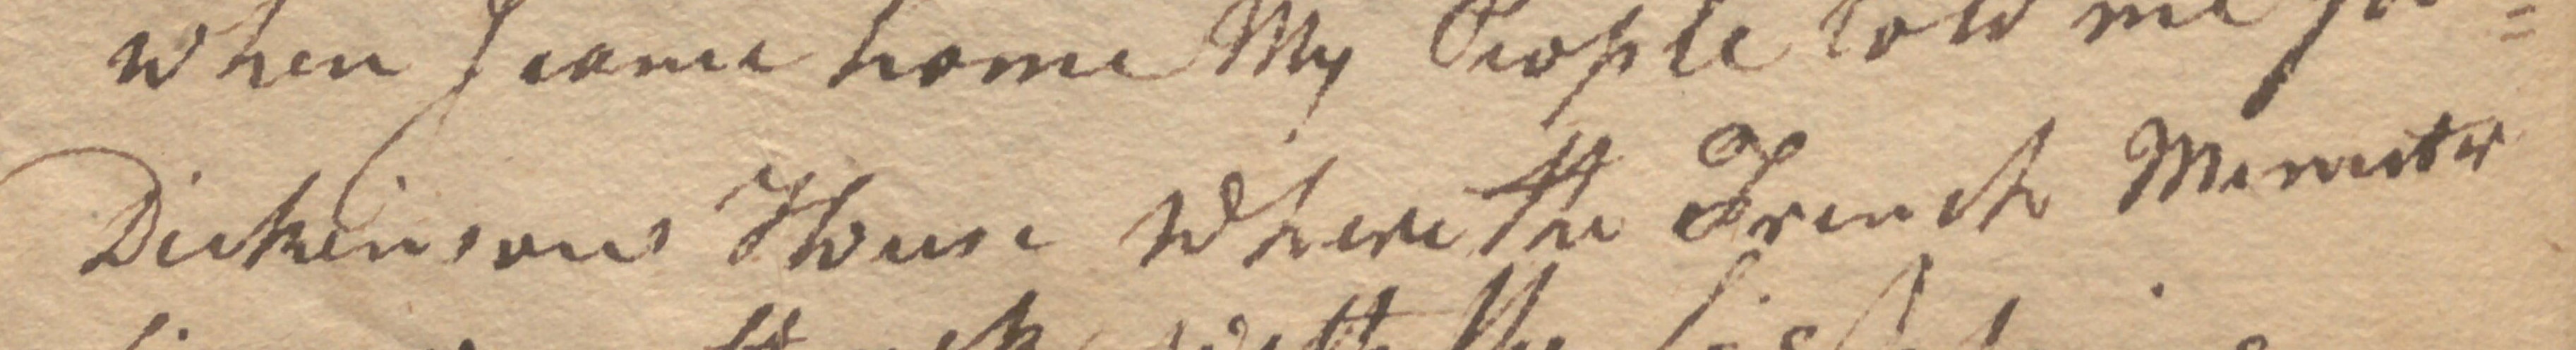Dickinsons House where the French Minister
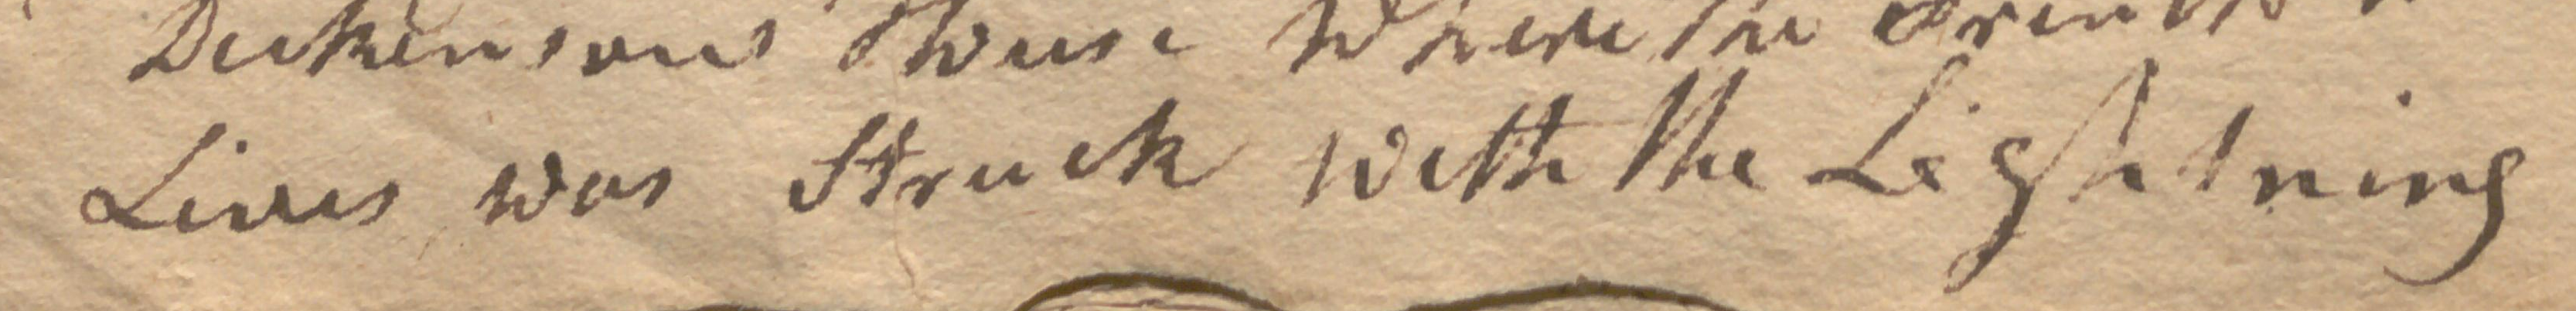Lives was Struck with the Lightning
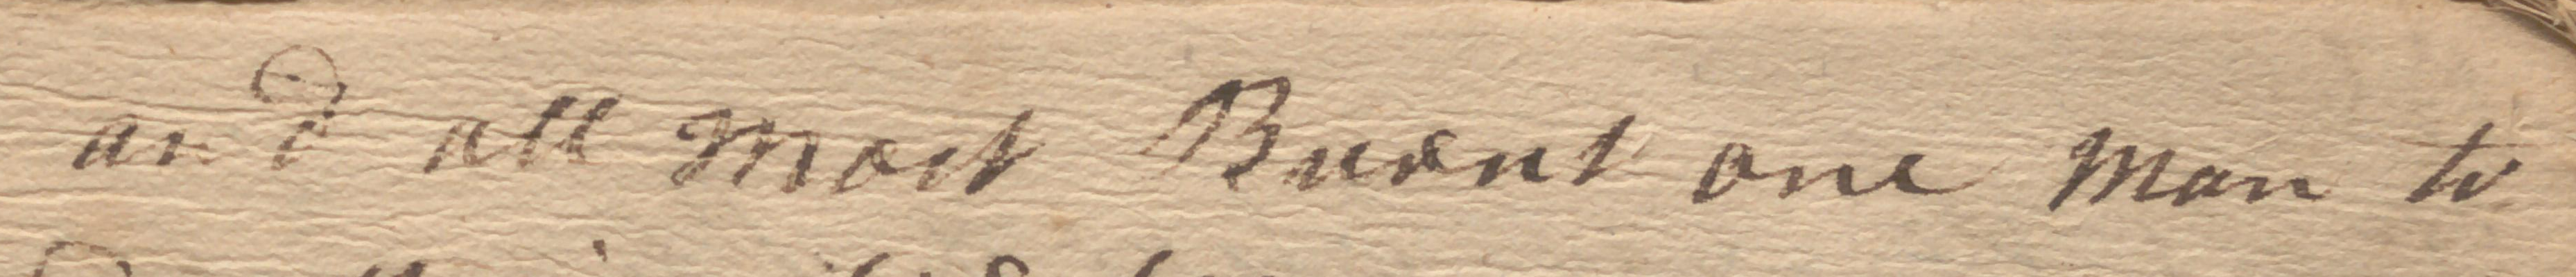and all most Burnt one man to
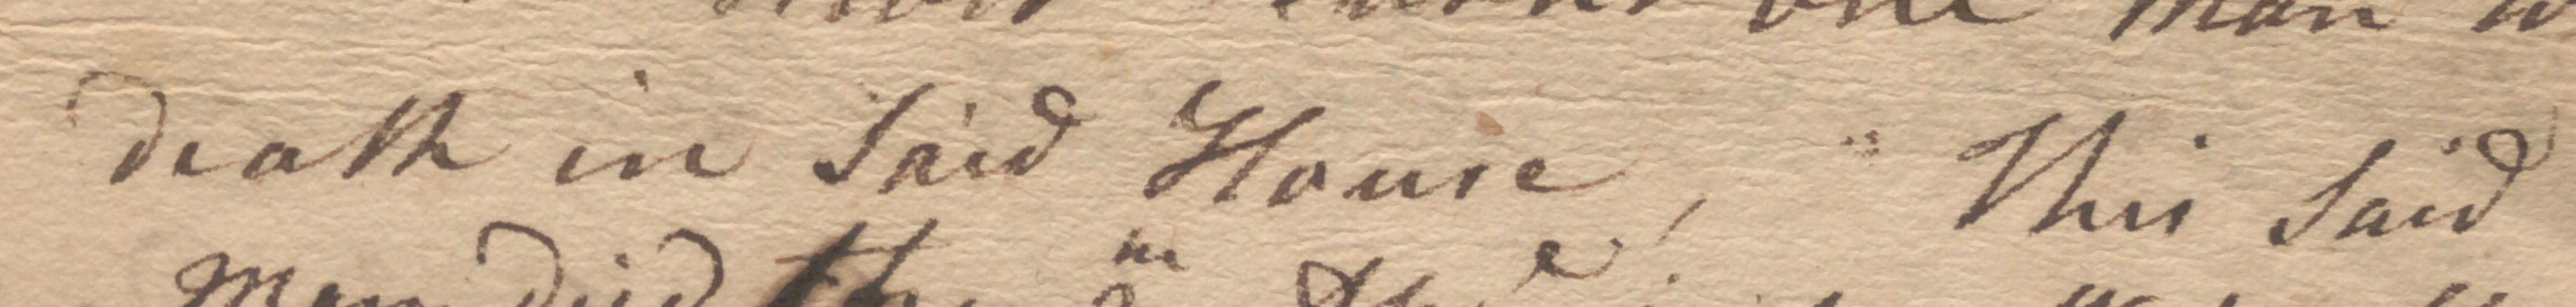death in said House, This Said
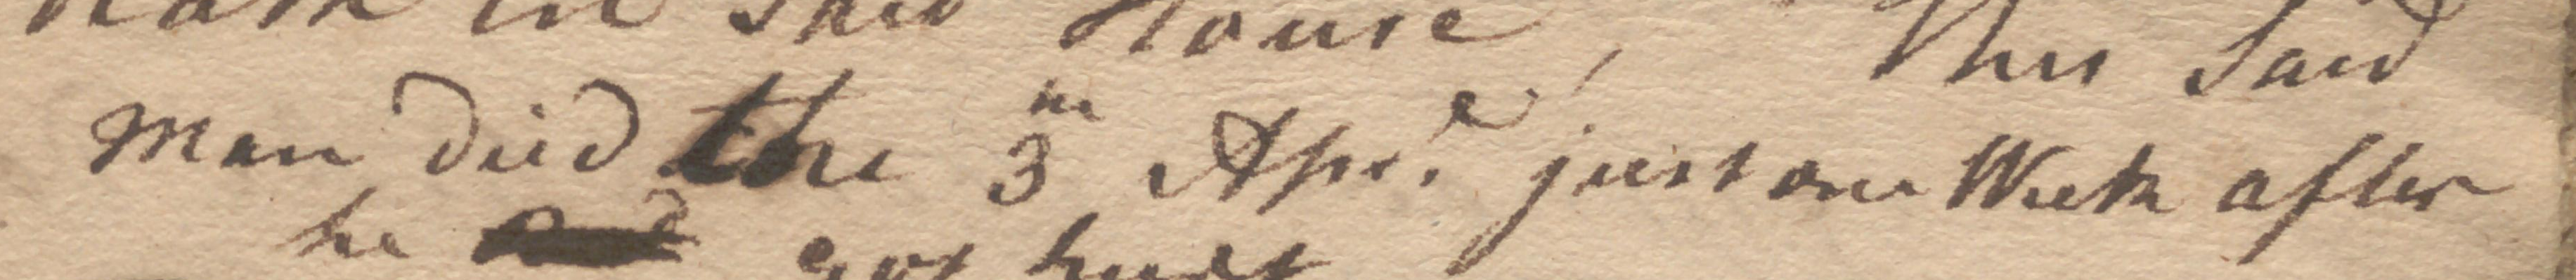man deed the 3^th Apr^l. just one Week after
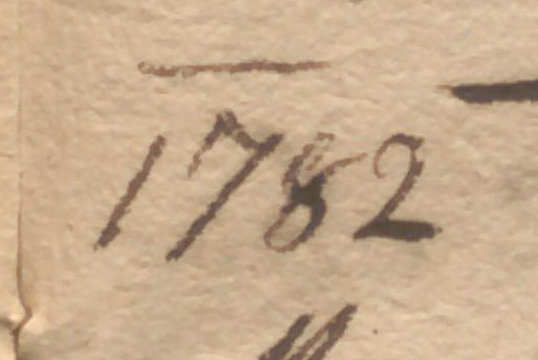1782
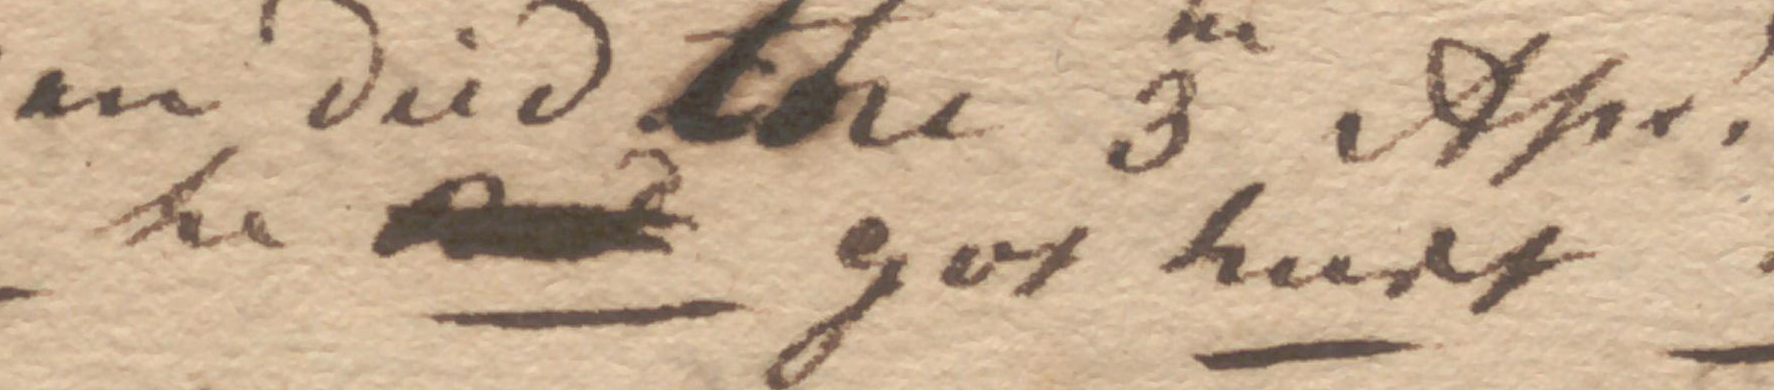he [_____] got hurt
